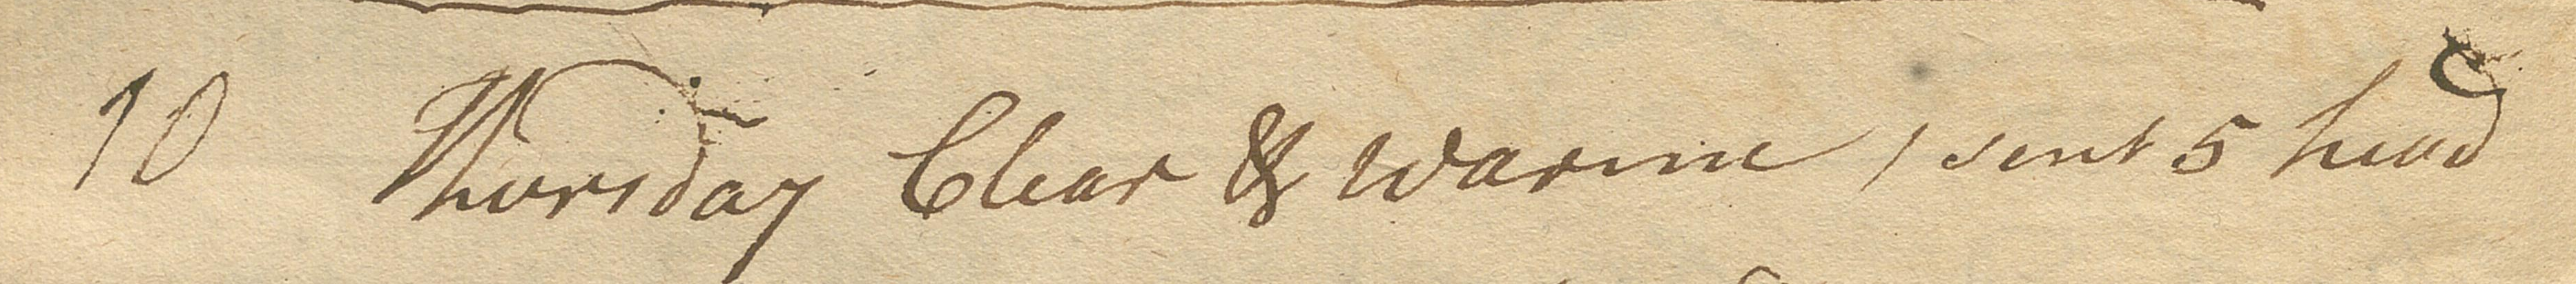10 Thursday Clear & warme, sent 5 head
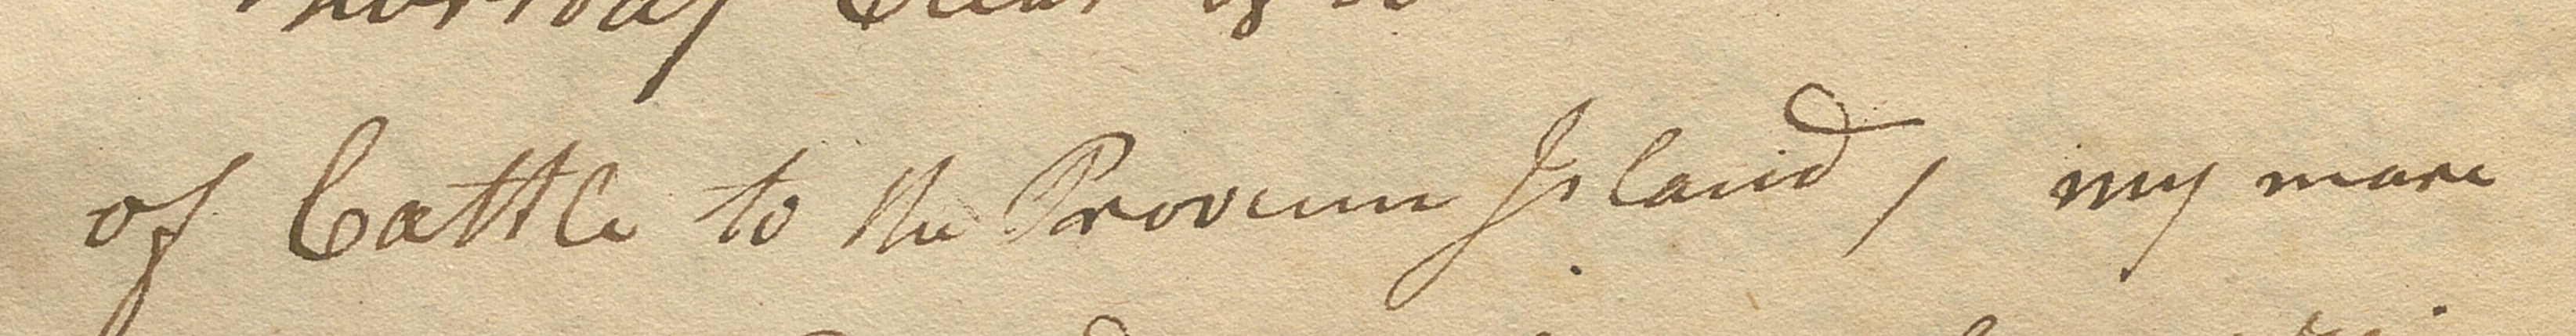of Cattle to the Provence Island, my mare
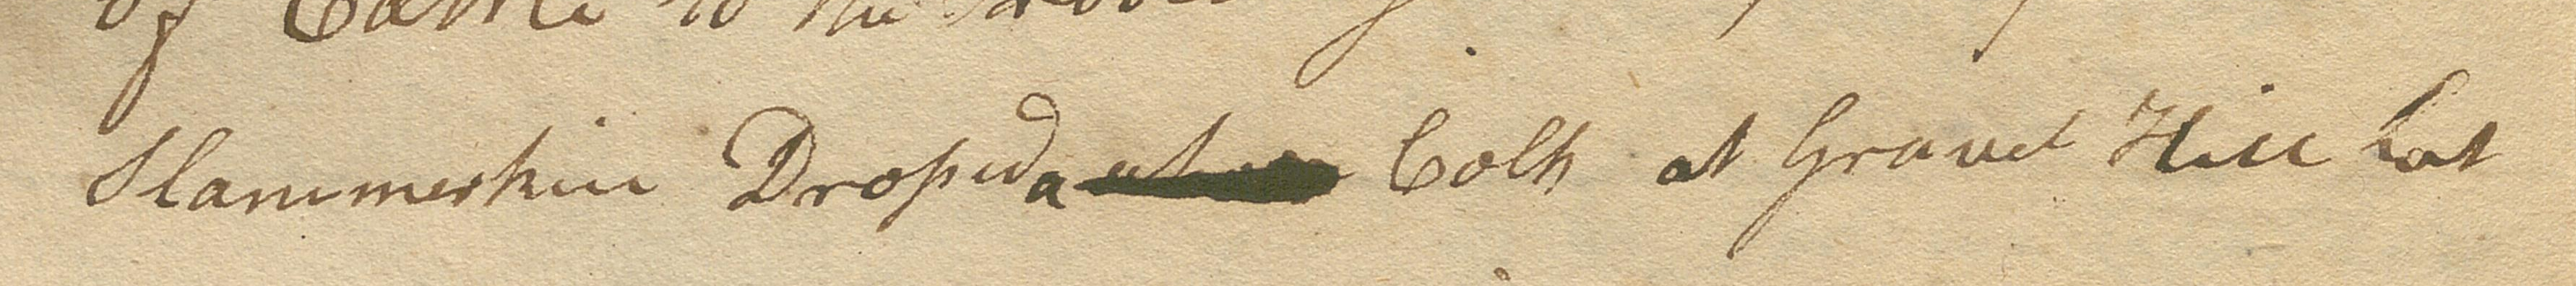Slammerkin Droped a [____] Colt at Gravel Hill Lot
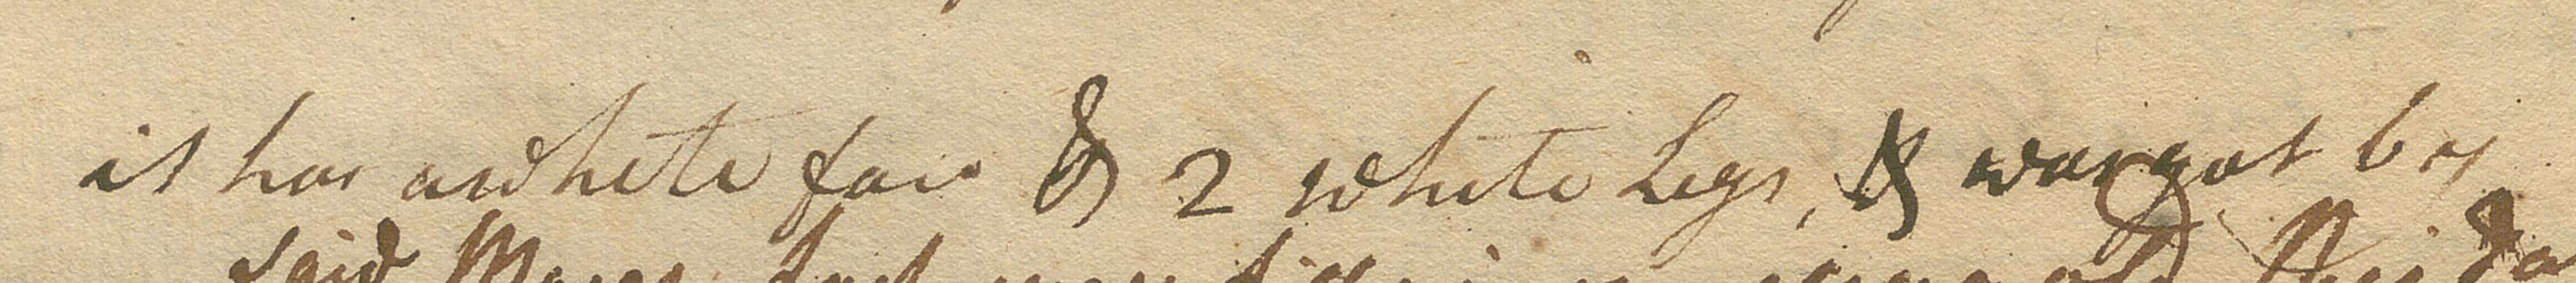it has a white face & 2 white Legs & was got by
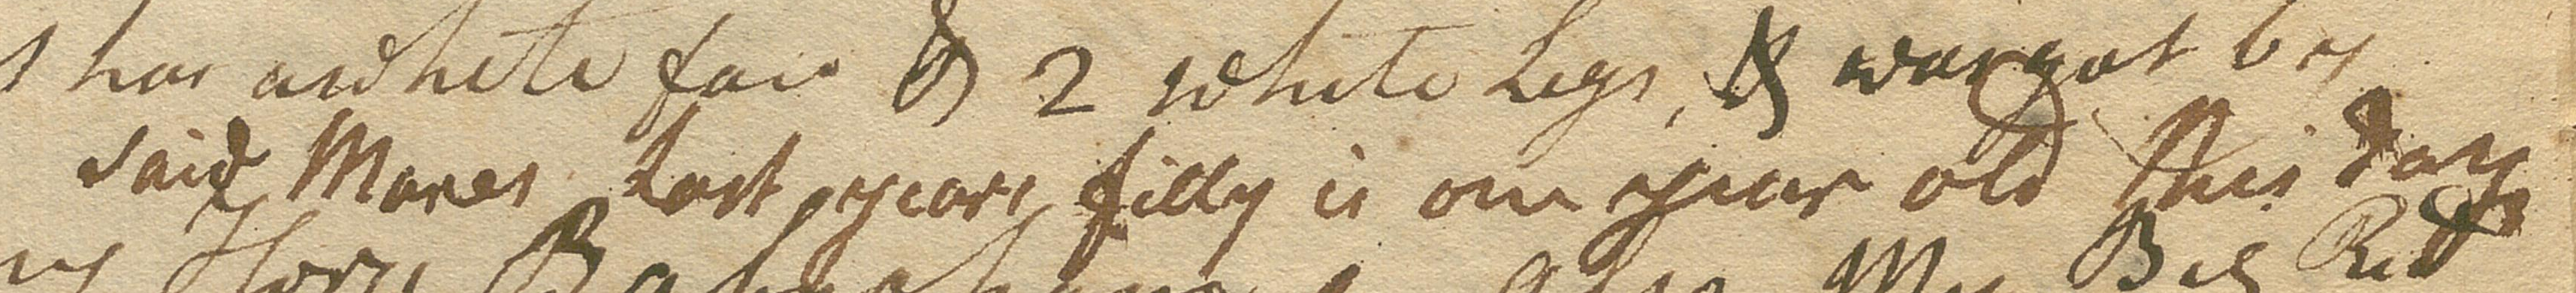saig Mares Last years filly is one year old this day
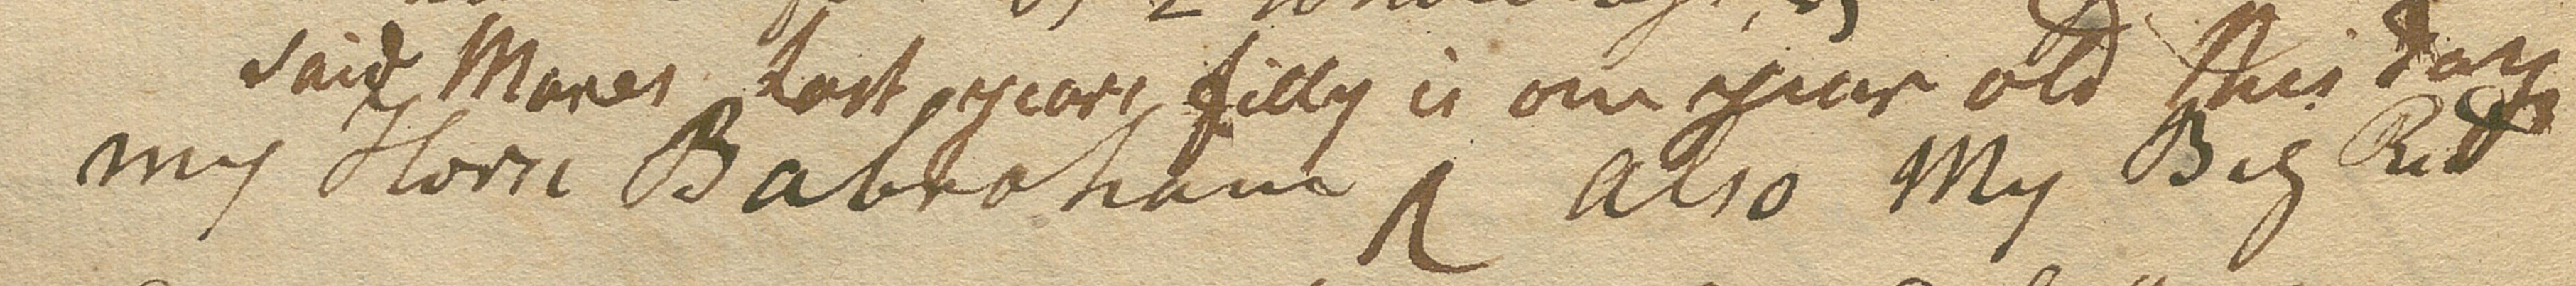my Horse Babraham ^ Also My Big Red
